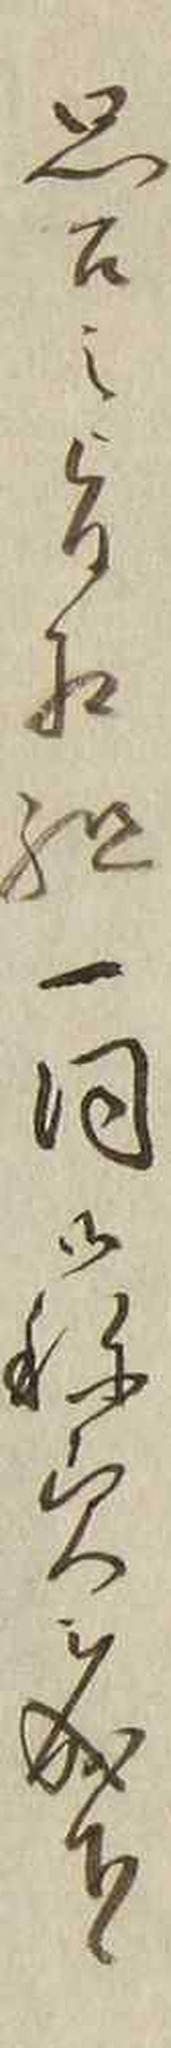思召之旨相組一同御称美被成下候

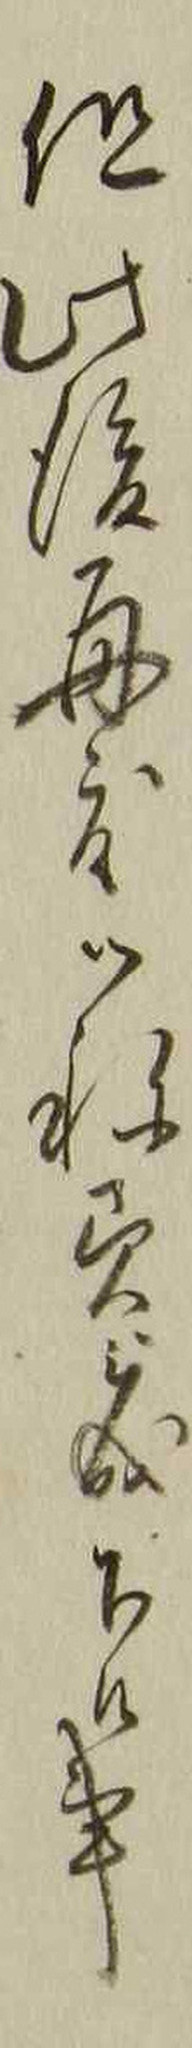但此後再度御称美被成下候事
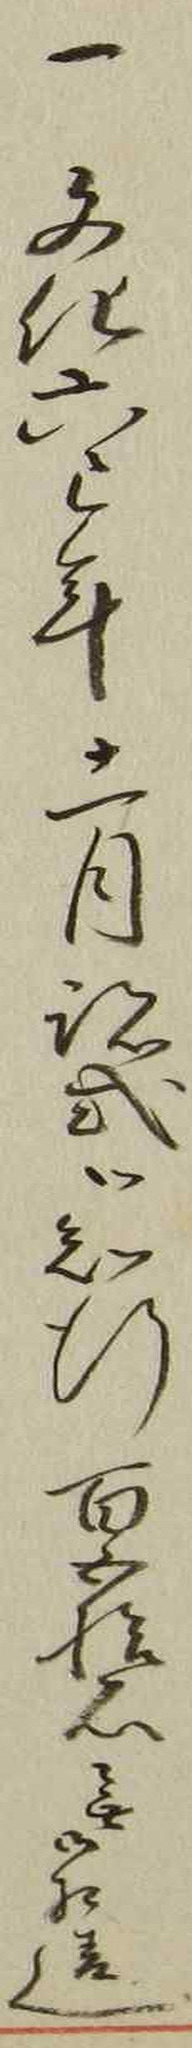一文化六巳年十一月跡式御知行百五拾石無御相違
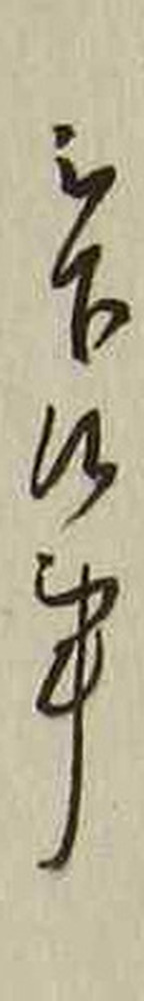被下候事
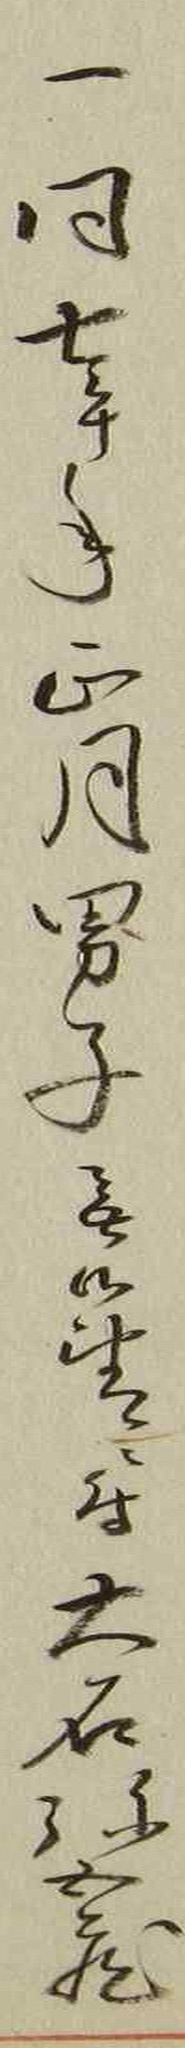一同七午年正月男子無御生に付大石弥五蔵
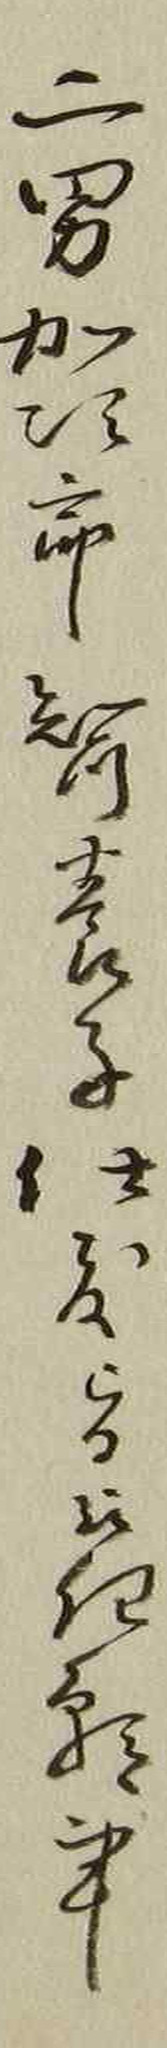二男加次郎婿養子仕度旨被任願候事
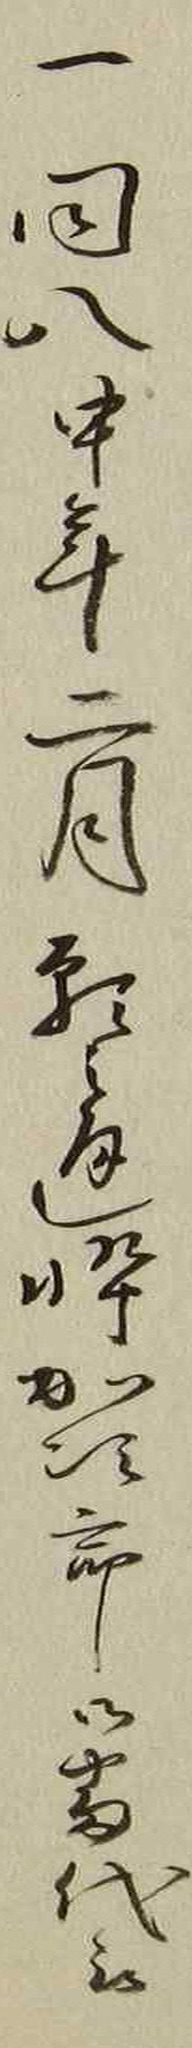一同八申年二月願之通忰加次郎御番代被
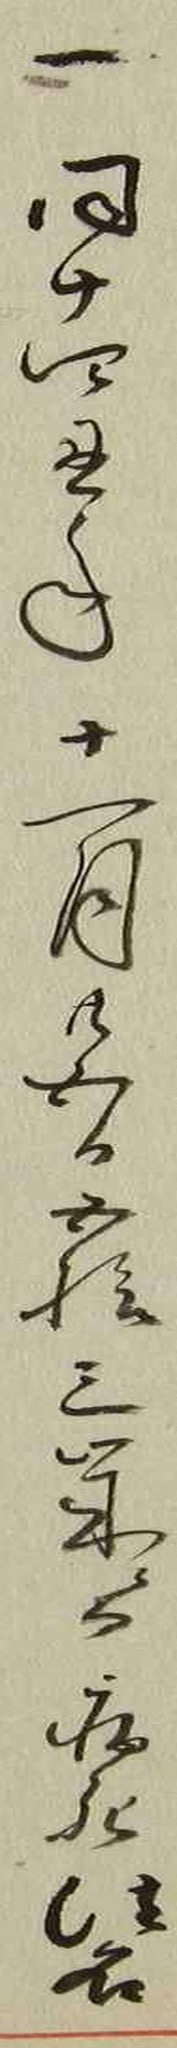一同十四丑年十一月廿五日五拾三歳に而病死法名
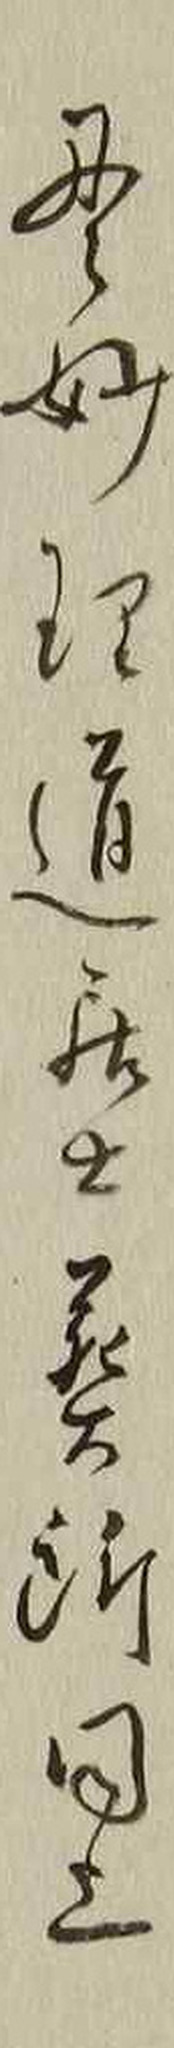盡妙理道居士葬所同上
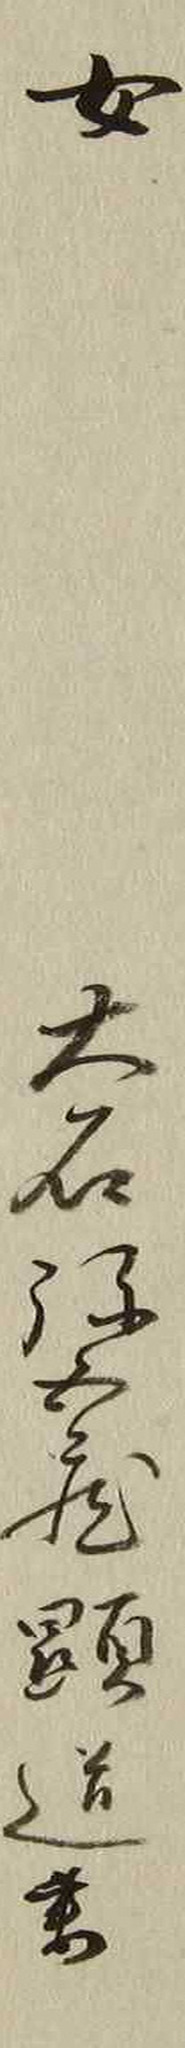女大石弥五蔵顕道妻
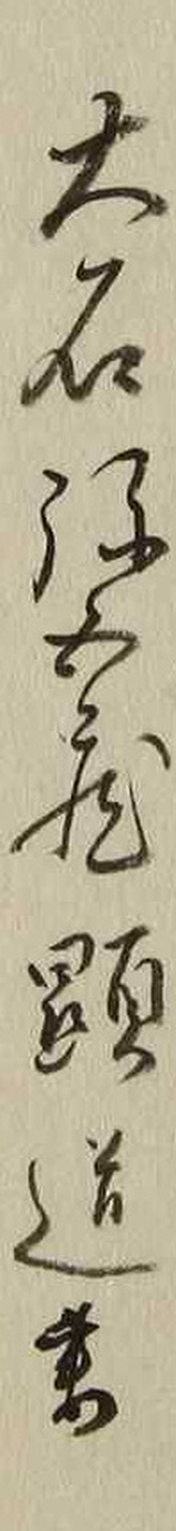女大石弥五蔵顕道妻
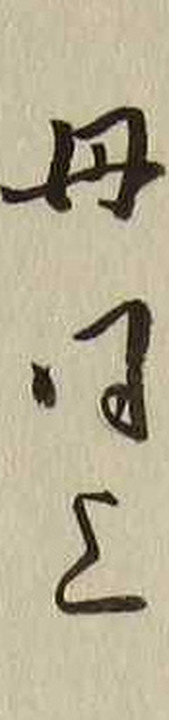母同上
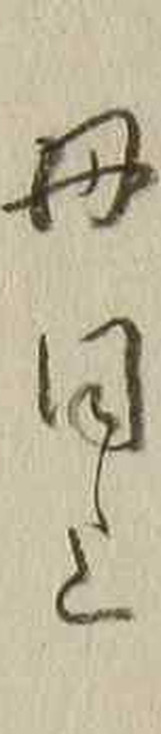母同上
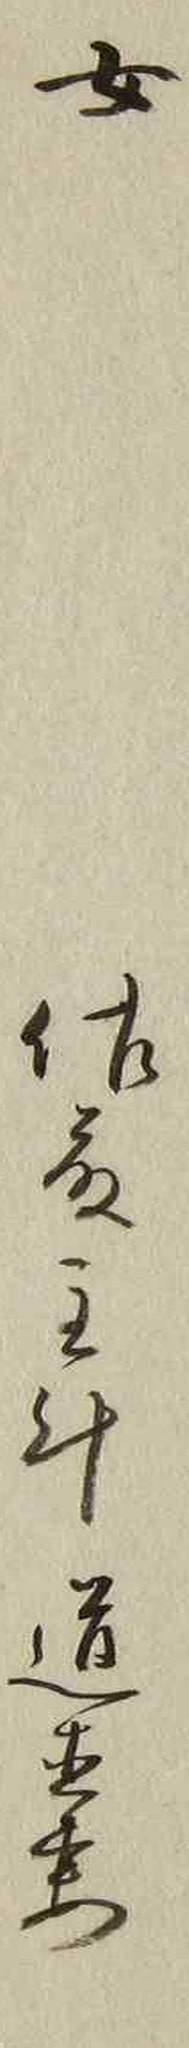女佐藤主計道直妻
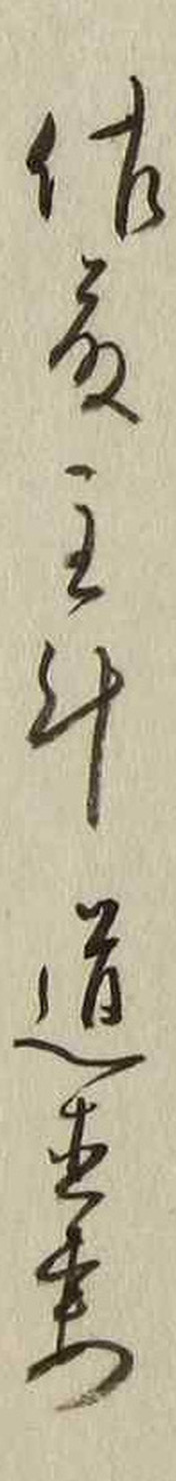女佐藤主計道直妻
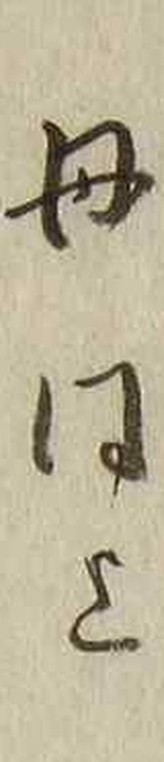母同上
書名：諸士系譜　巻之6　い之部6
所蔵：会津若松市立会津図書館
